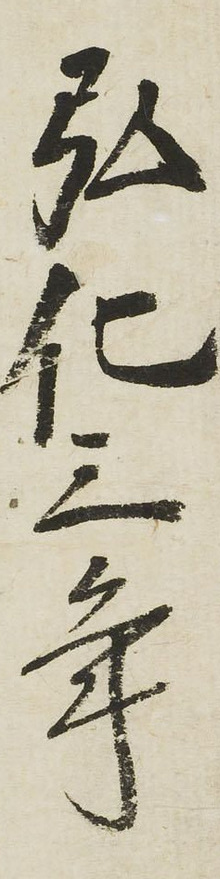弘化三年
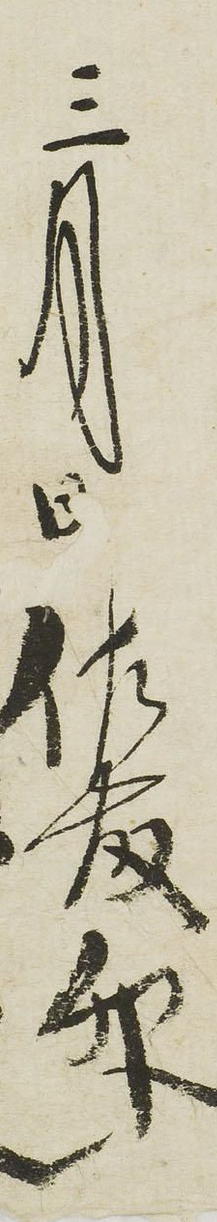三月日佐藤卯八
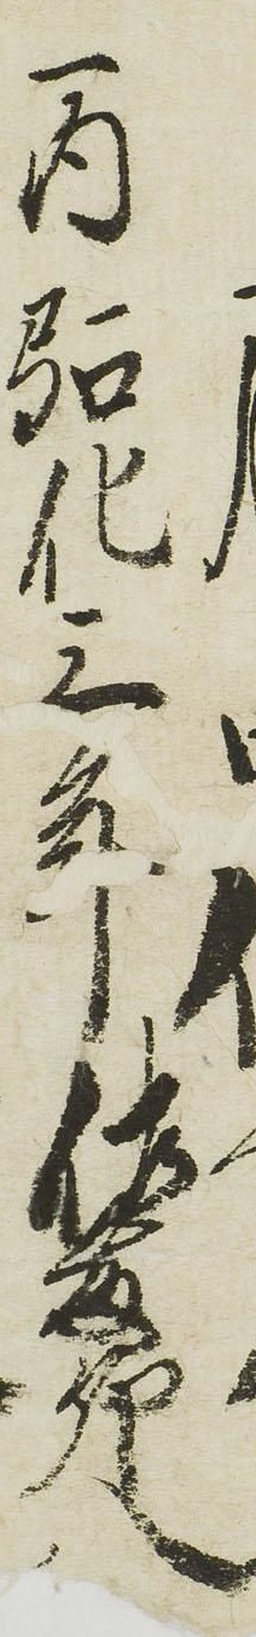丙弘化三年佐藤卯八
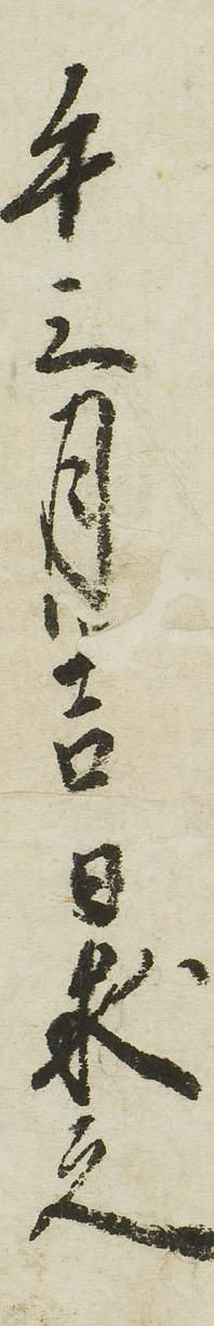午三月吉日求之

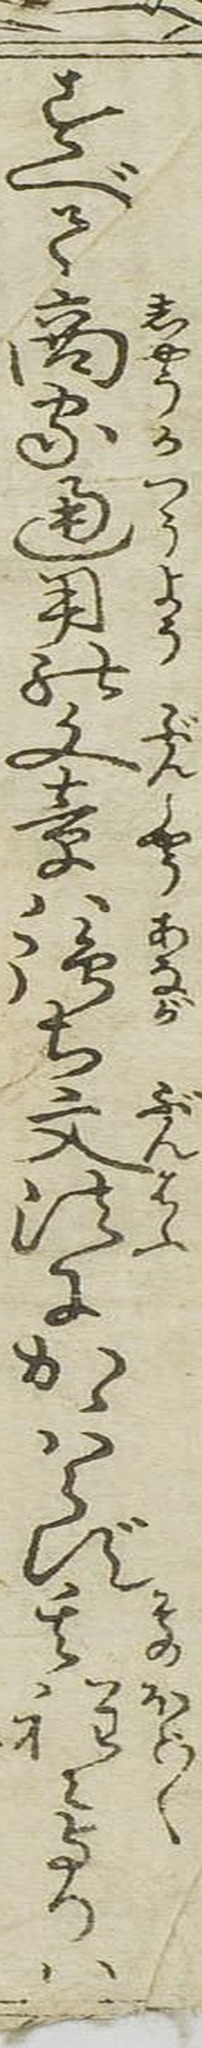すべて商家通用の文章は強ち文法にかゝはらず其程々よりは
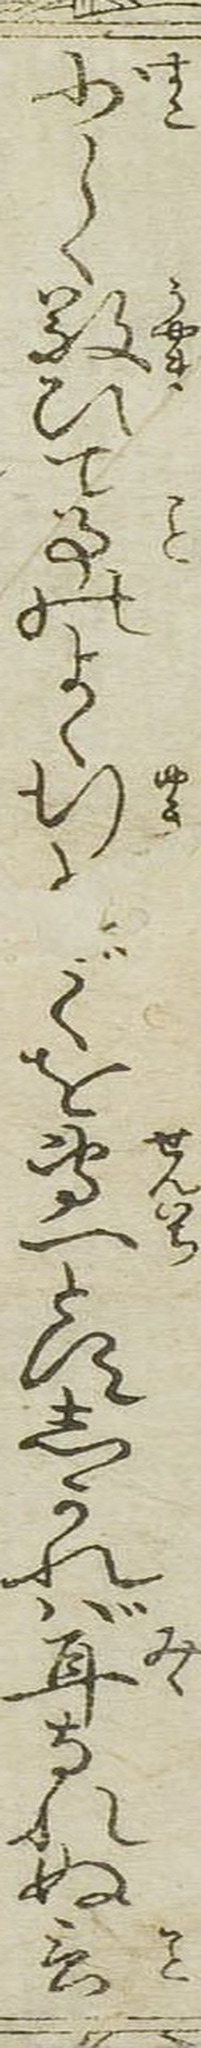少しく敬ひて事のよく行とゞくを専一とすしかれば耳なれぬ言
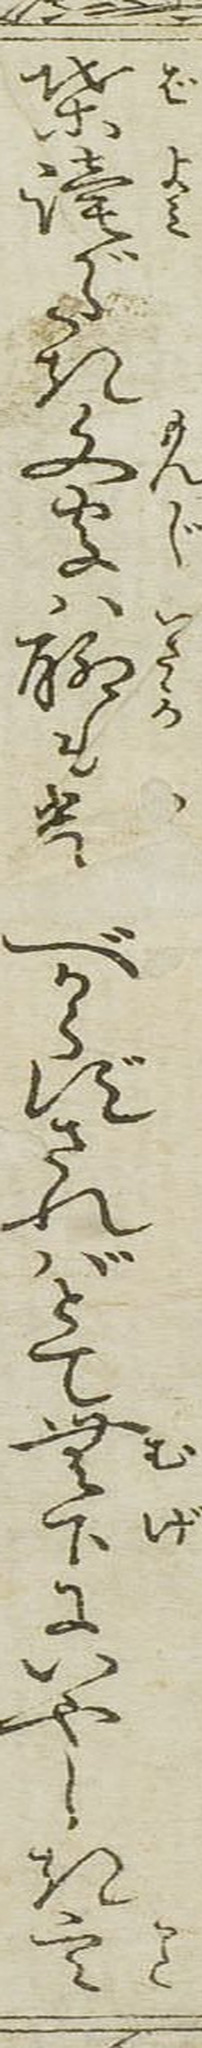葉読がたき文字は聊もべからずさればとて無下にいやしき言
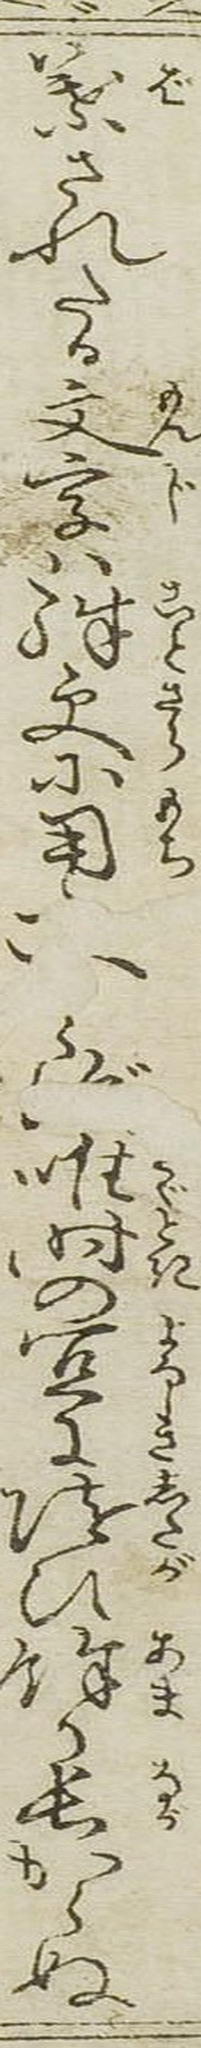葉されたる文字は殊更に用へらず唯時の宜に随ひ余り長からぬ
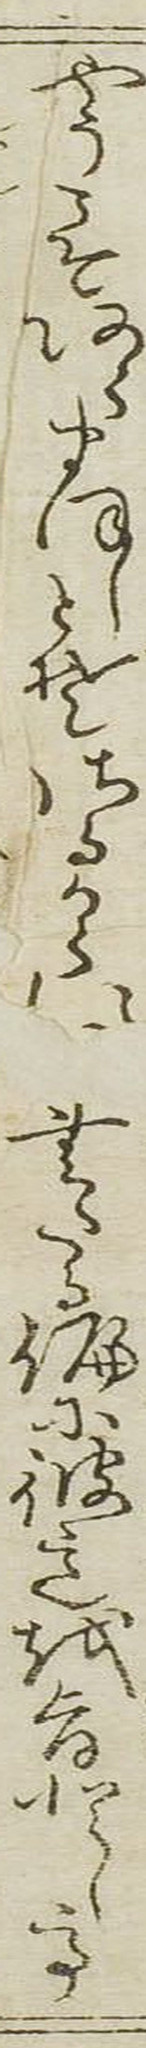やうこそあらまほしとぞさるから書たる偏に彼意を旨として
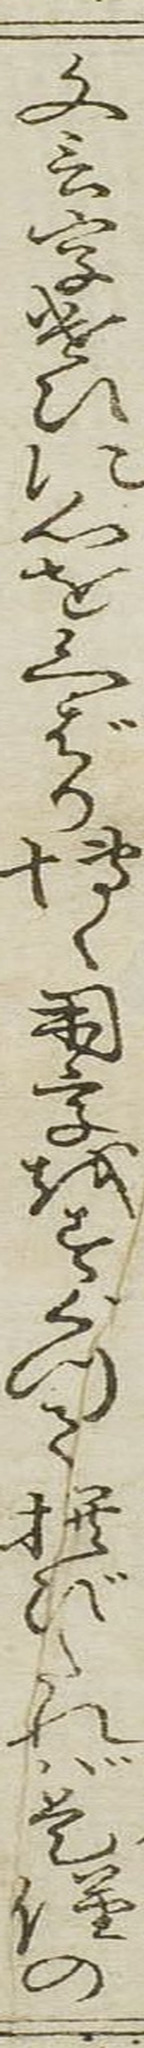文言字遣ひに心をくばり博く用字をすぐつて撰びたれば是僅の
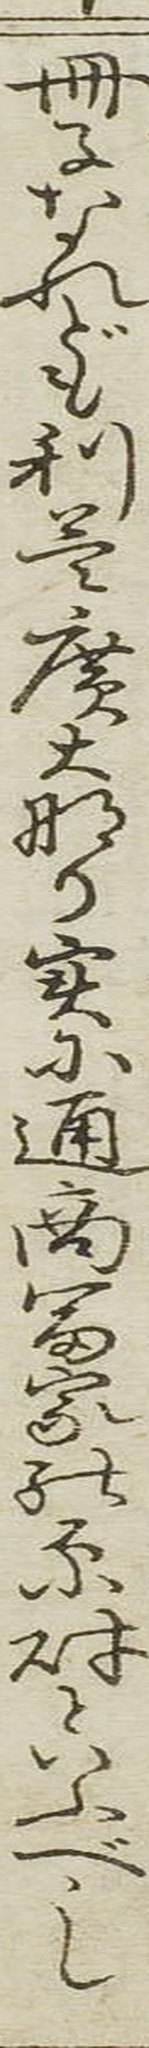冊子なれども利益広大なり実に通商富家の原財といふべし
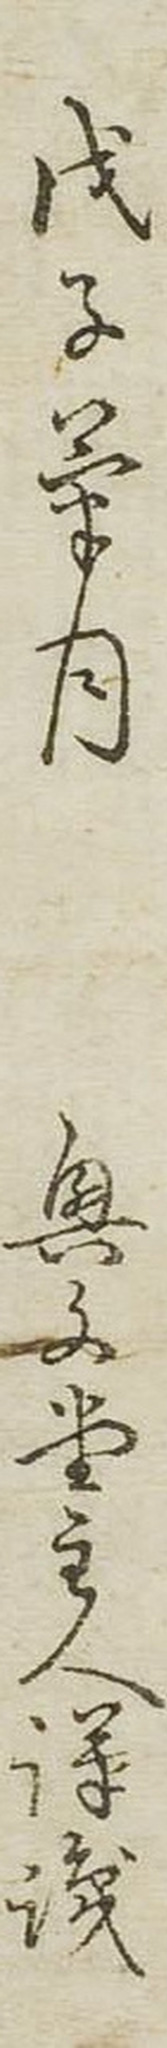戊子皐月興文堂主人謹識
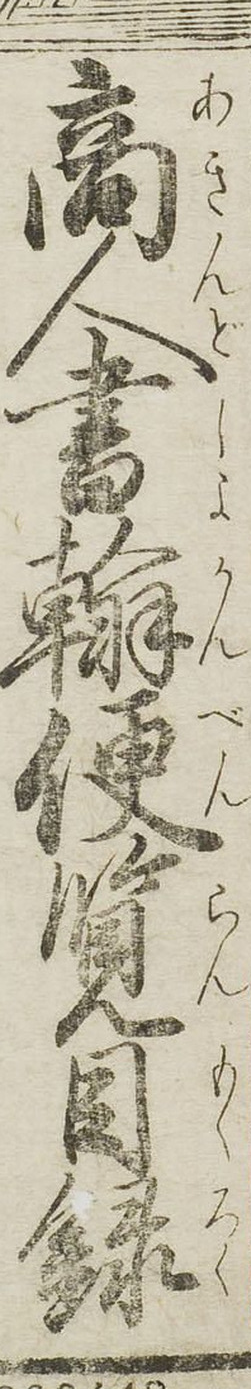商人書翰便覧目録

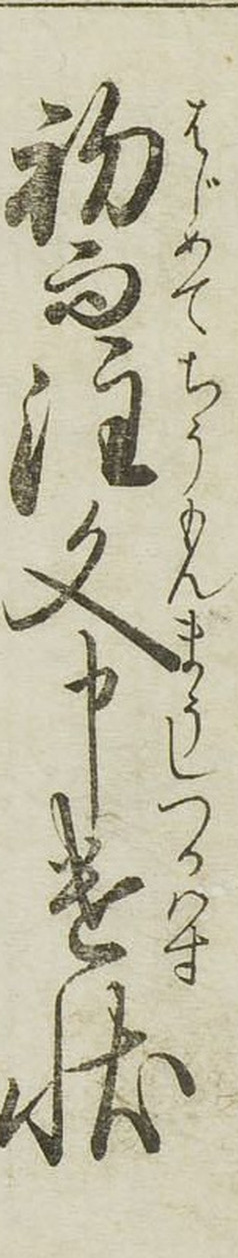初而注文申遣状九
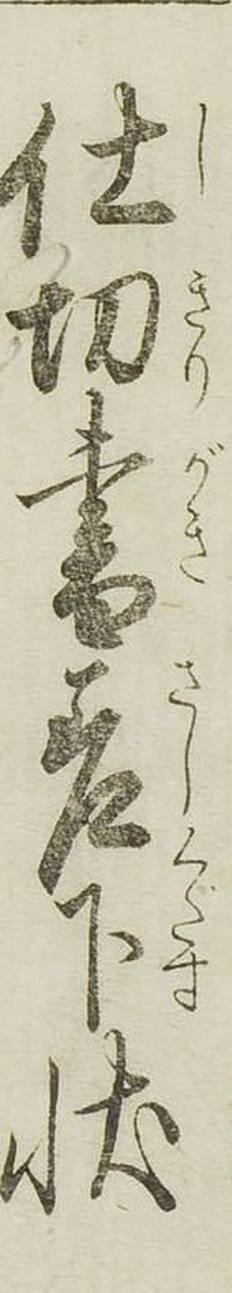仕切書差下状十一
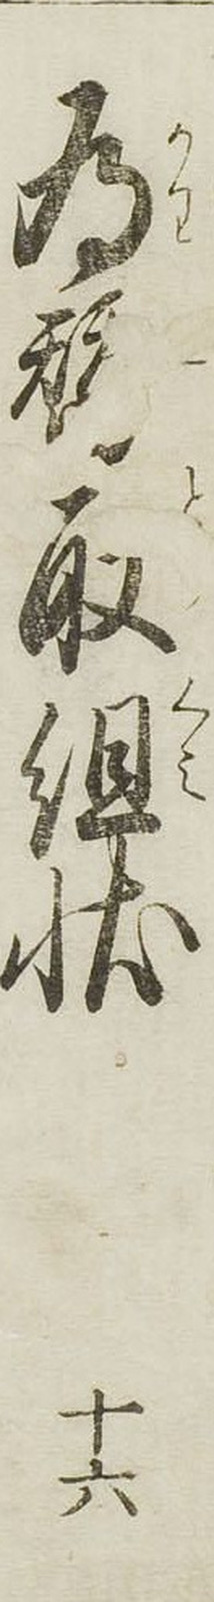為替取組状十六
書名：商人書翰便覧
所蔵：東京学芸大学教育コンテンツアーカイブ
